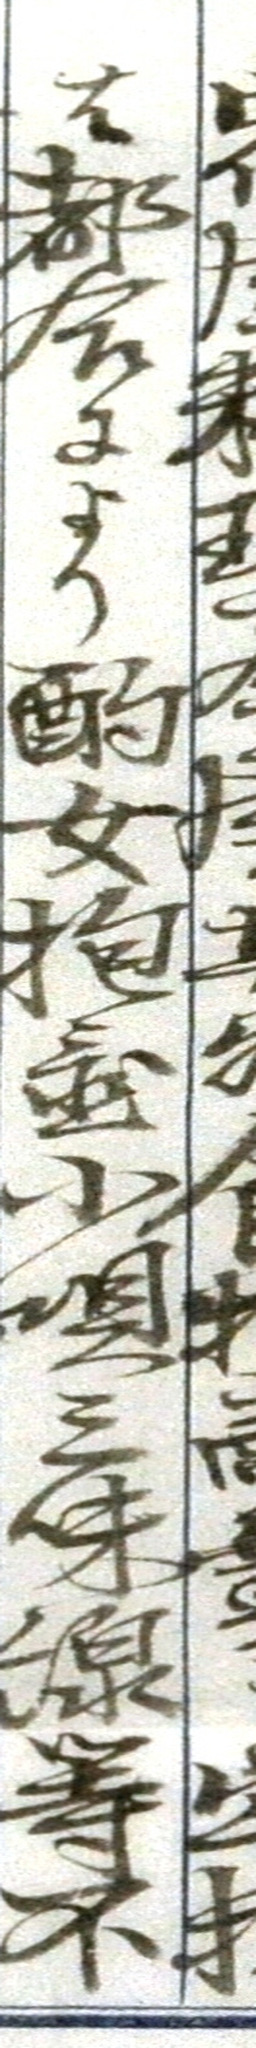は都合により酌女抱置小唄三味線等不
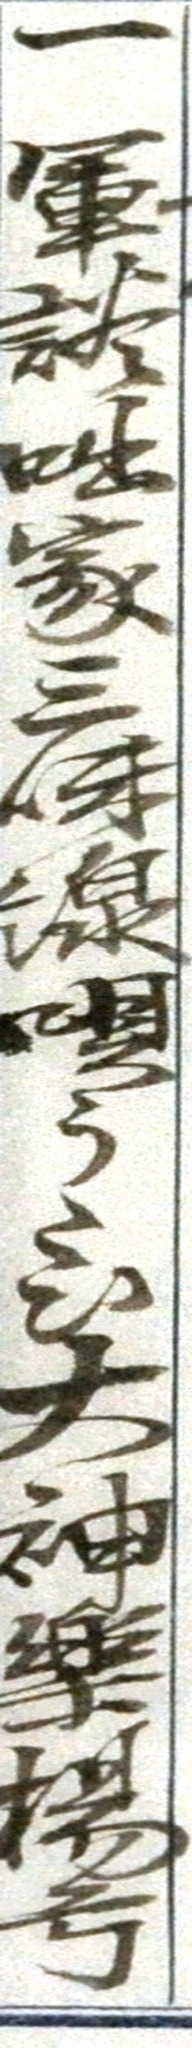一軍談咄家三味線唄うたひ大神楽揚弓
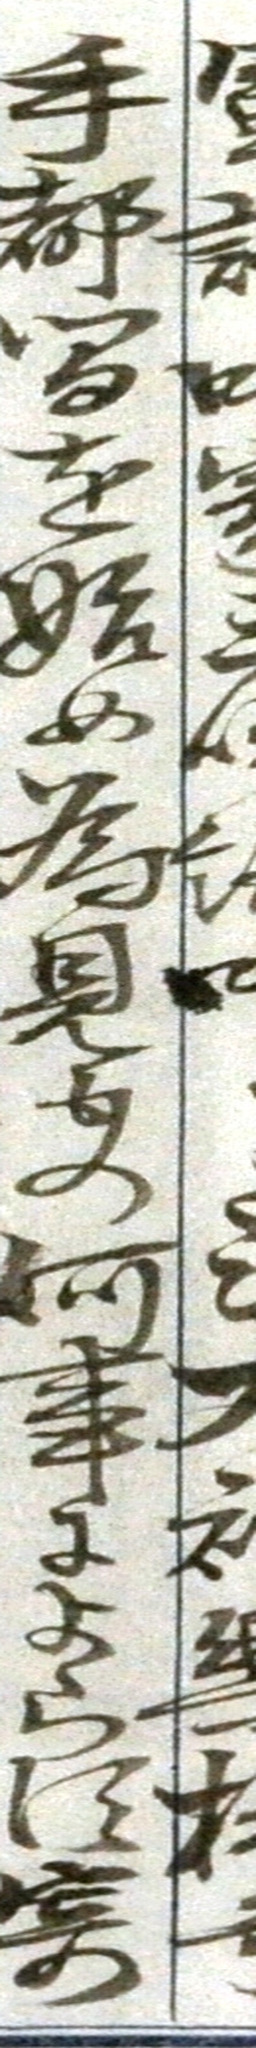手都間を始め為見もの何事によらす寄
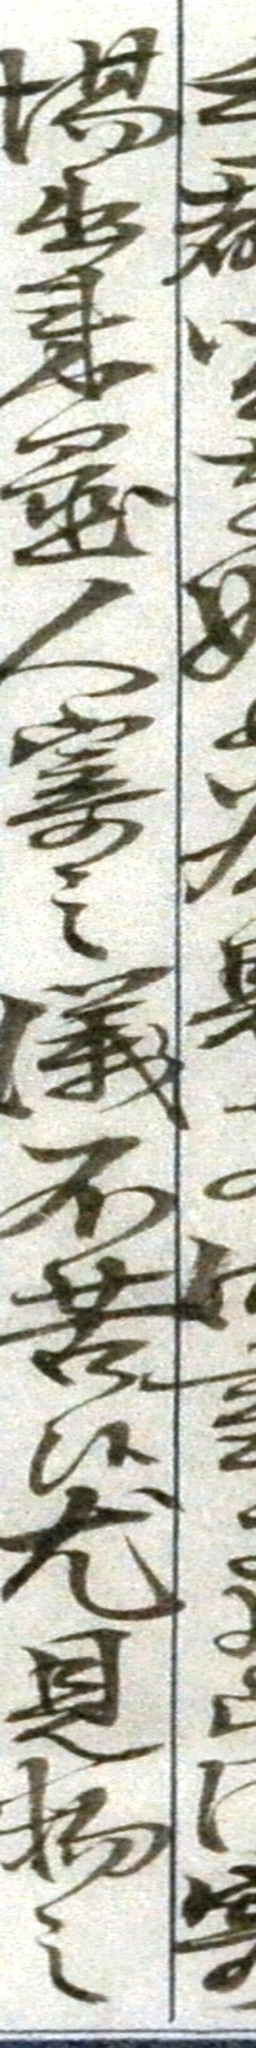場出来置人寄之儀不苦候尤見物之
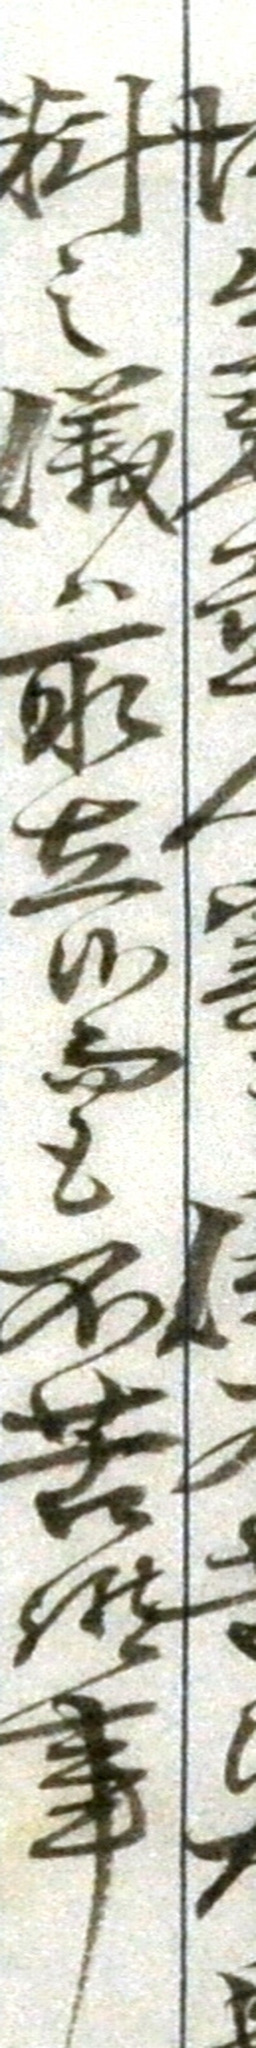料之儀は取立候而も不苦候事
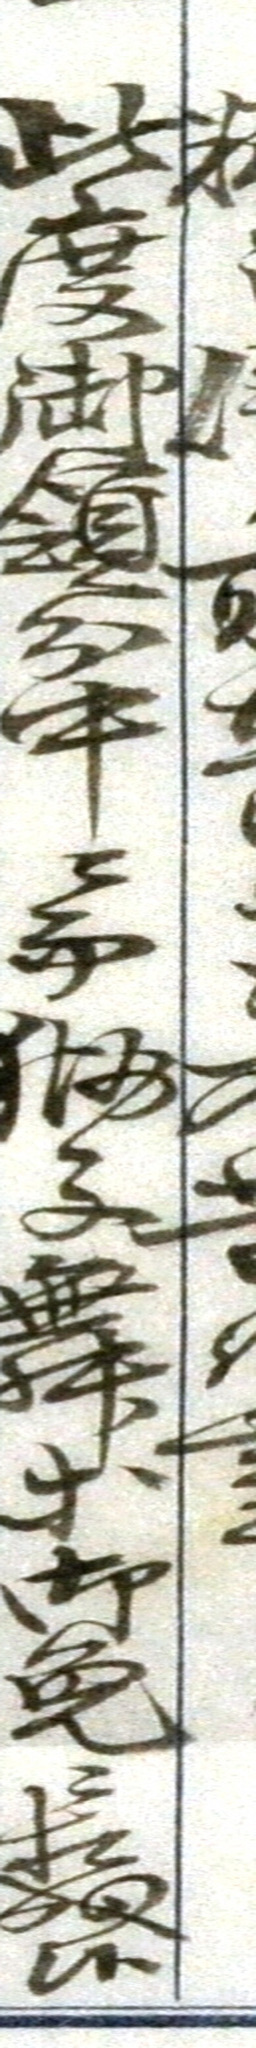一此度御領分中ニ而獅子舞等御免ニ相成候
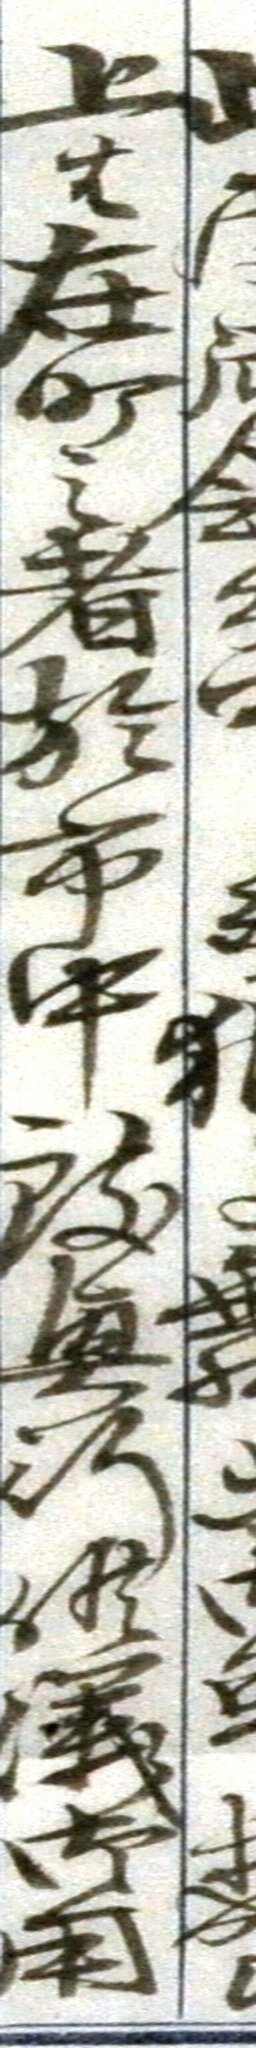上は在町之者於市中致興行候儀御用
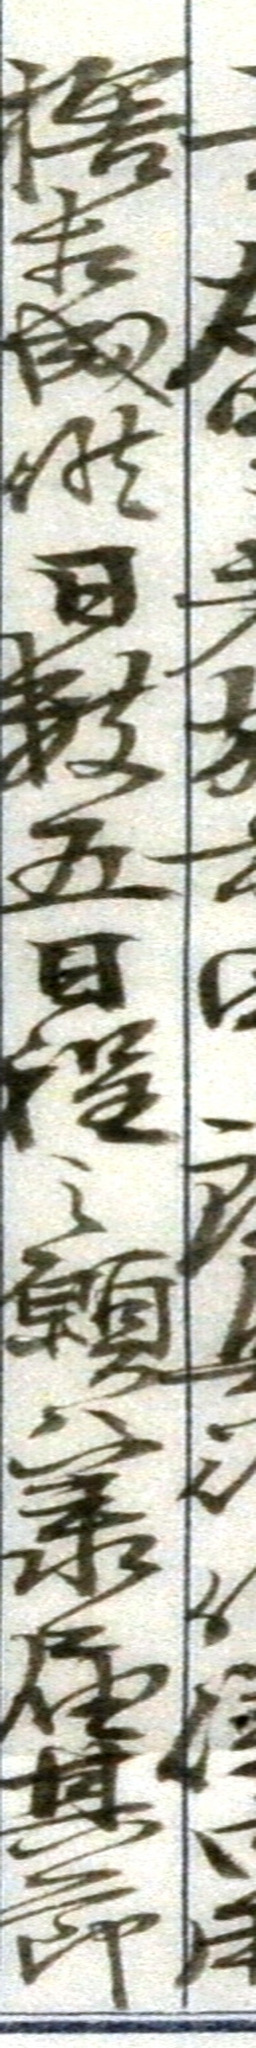捨相成候日数五日程之願は承届其節
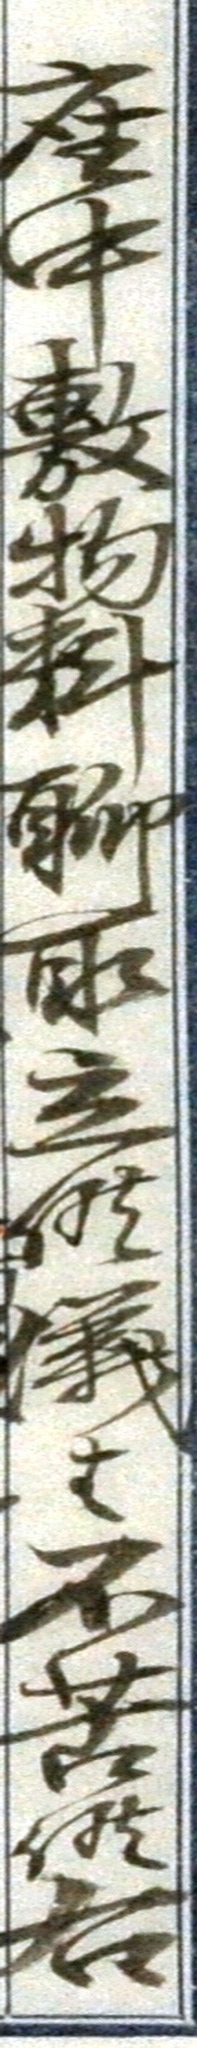座中敷物料聊取立候儀は不苦候右
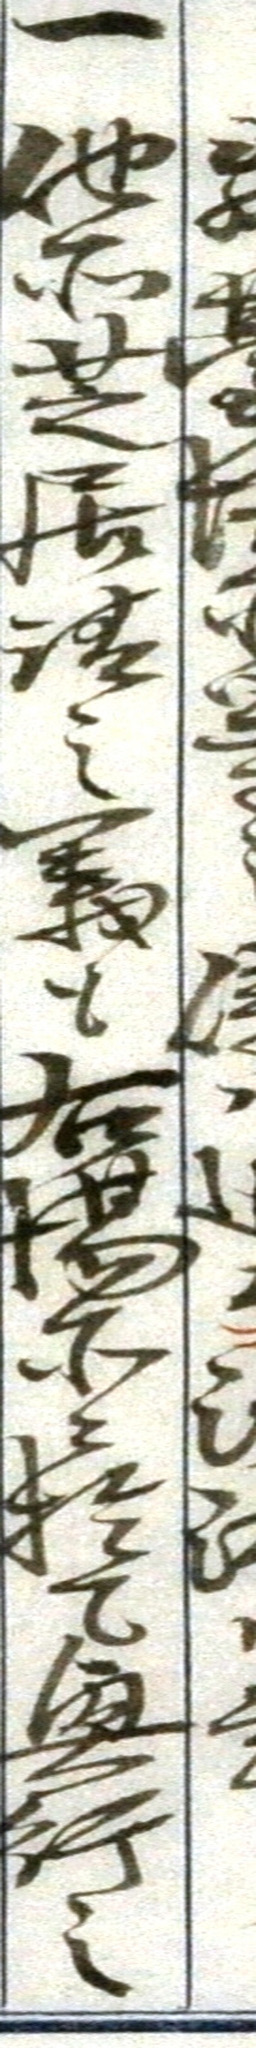一他所芝居請之義も右場所ニ於て興行之
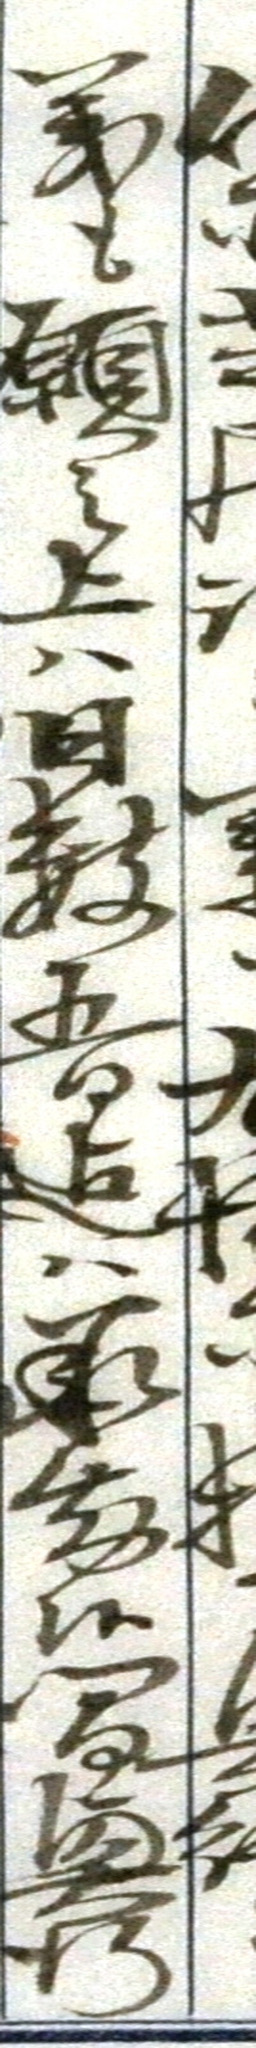義も願之上は日数五日迄は承知候間興行
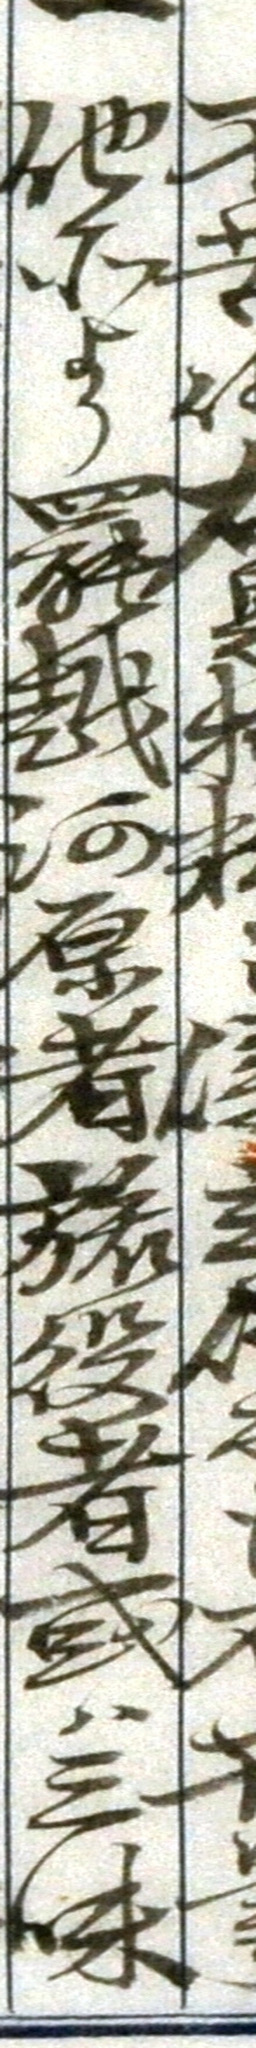一他所より罷越河原者旅役者或は三味
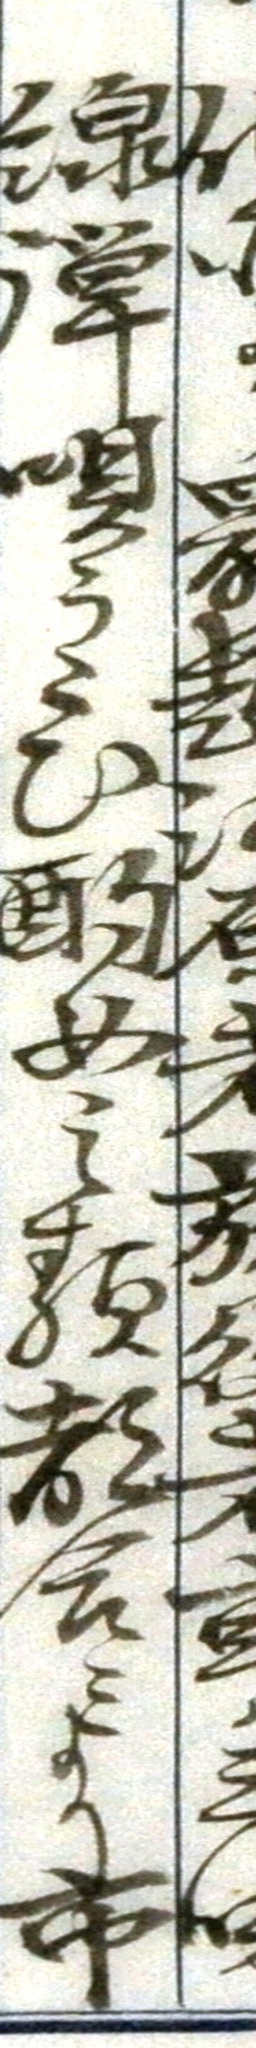線弾唄うたひ酌女之類都合ニより市
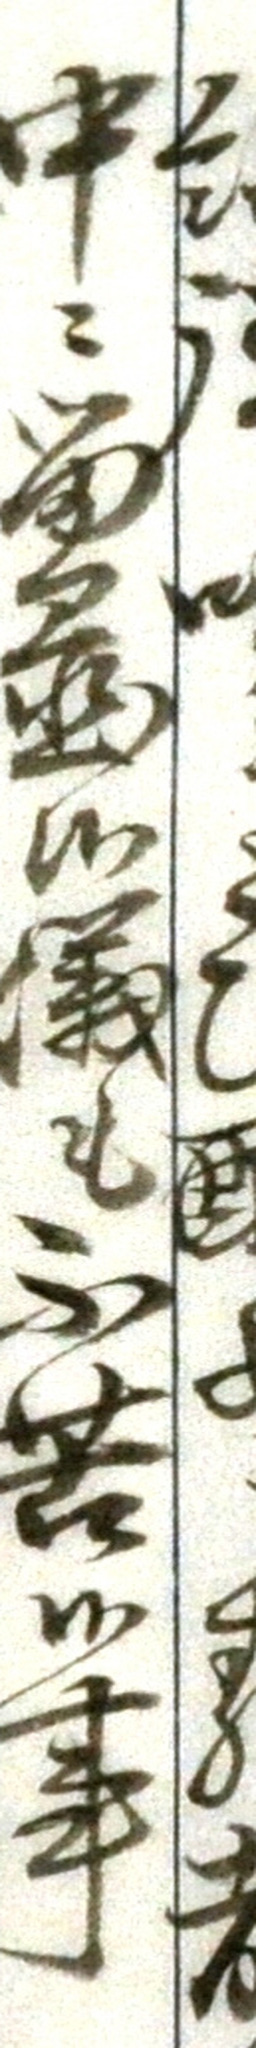中ニ留置候儀も不苦候事
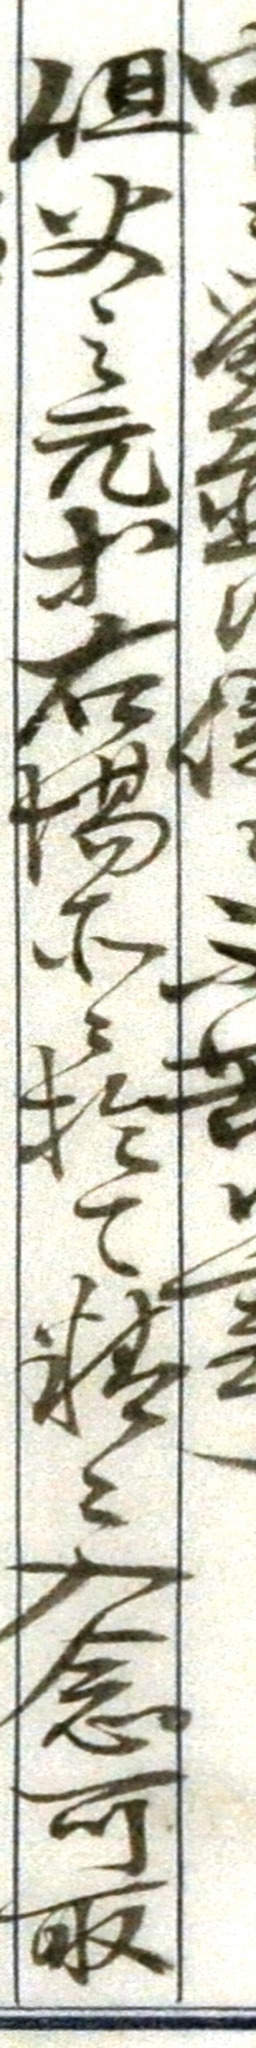但火之元等右場所ニ於て精々入念可取
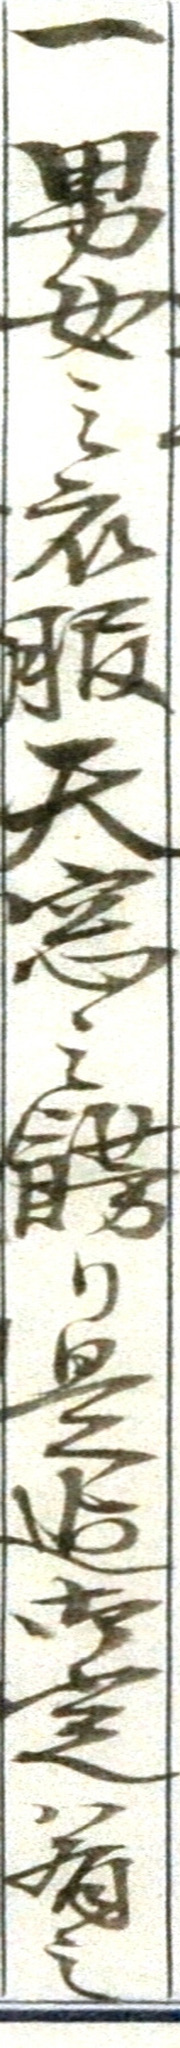一男女之衣服天窓之餝り是迄御定は有之
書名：潤緩方御触書
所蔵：伊那市立高遠町図書館・合同会社AMANE
